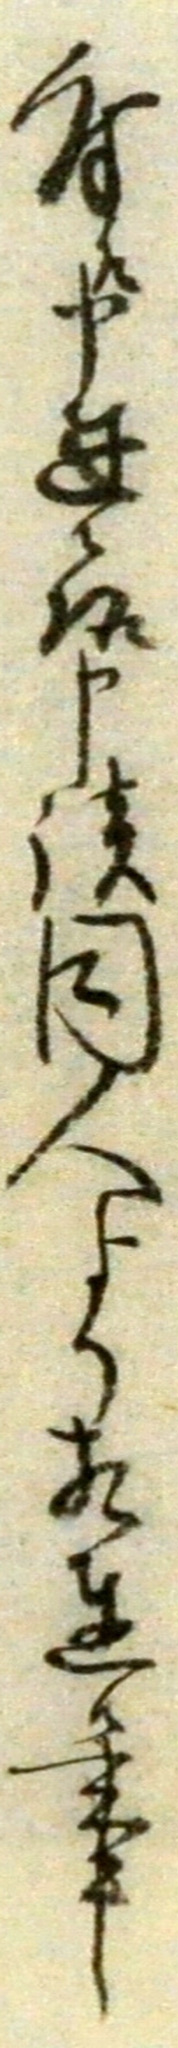付え申達候様申談同人より相達候事

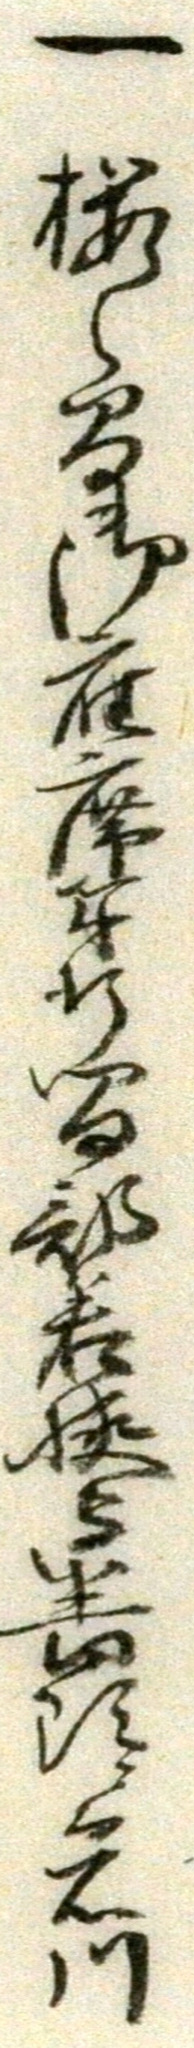一櫻之間御座席奉行間部若狭守番頭ニ而石川
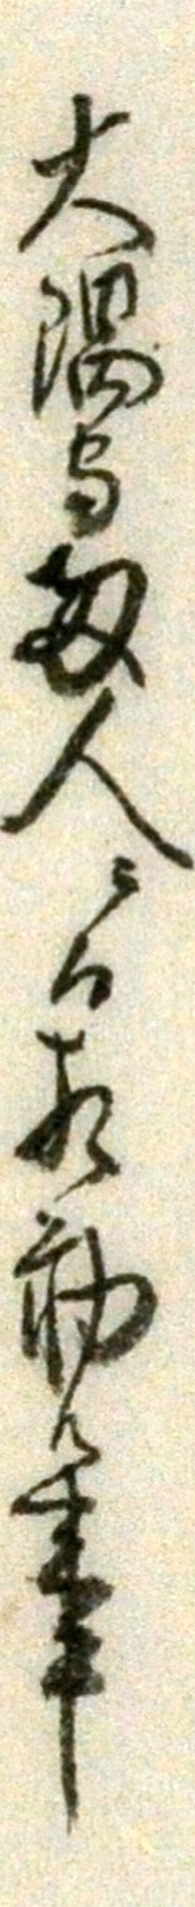大隅守両人ニ而相勤候事
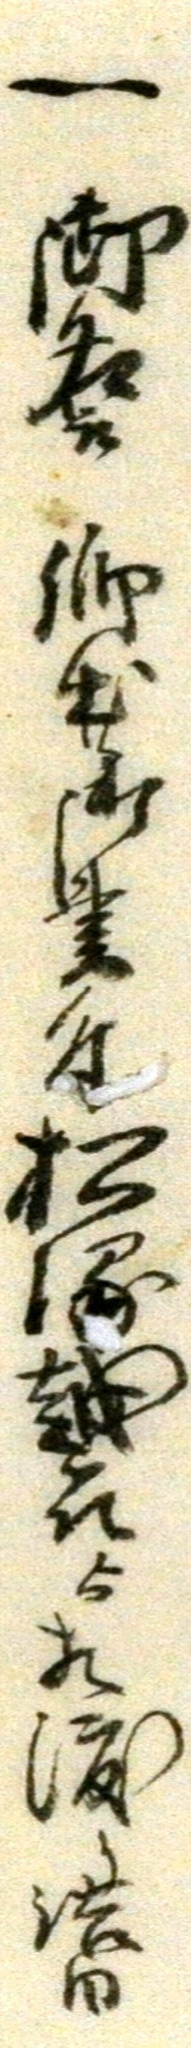一御名被仰出御書付松浦越州ゟ相渡り詰日
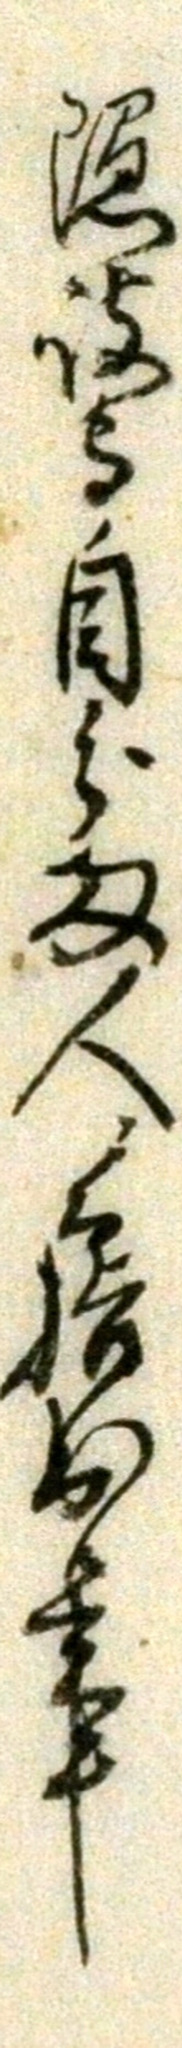隠岐守自分両人ニ而指出候事
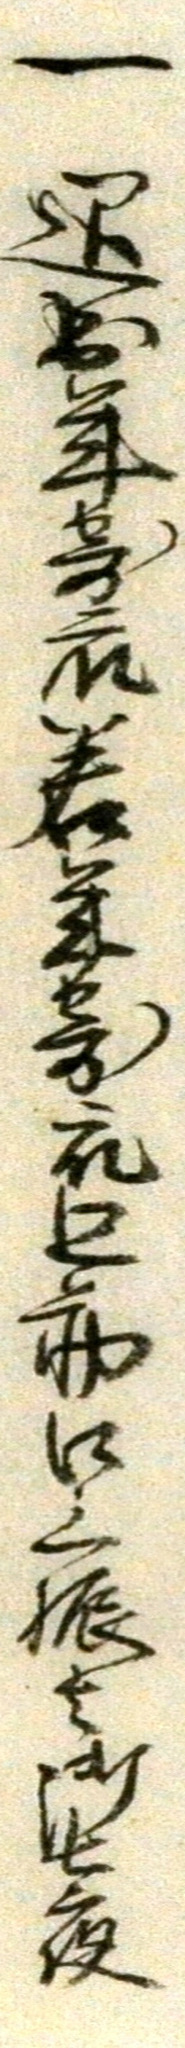一退出年寄衆若年寄衆廻勤口上振は御七夜
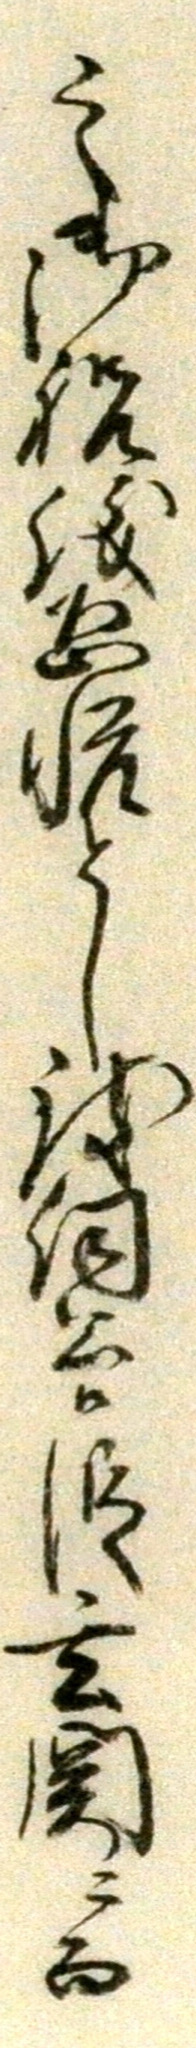之御祝儀恐悦とし致伺公候段玄関ニ而
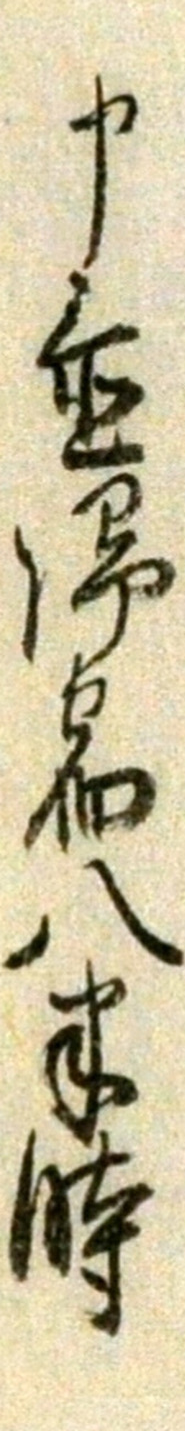申置帰宿八半時

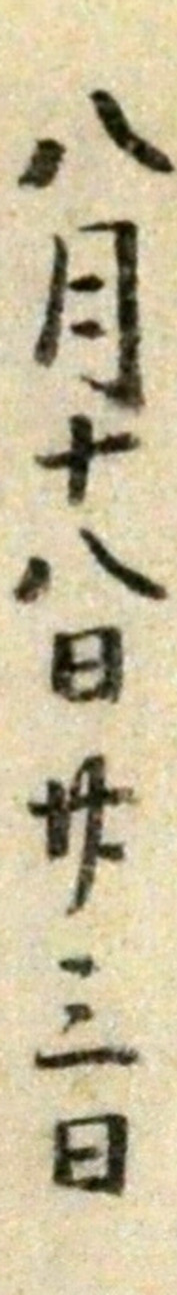八月十八日廿三日
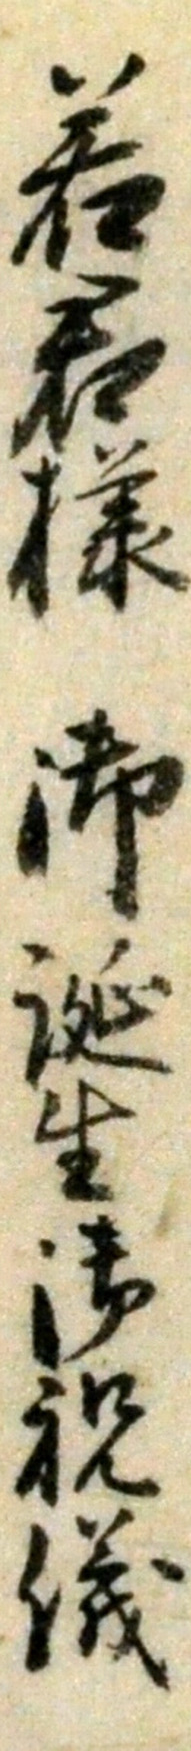若宮様御誕生御祝儀
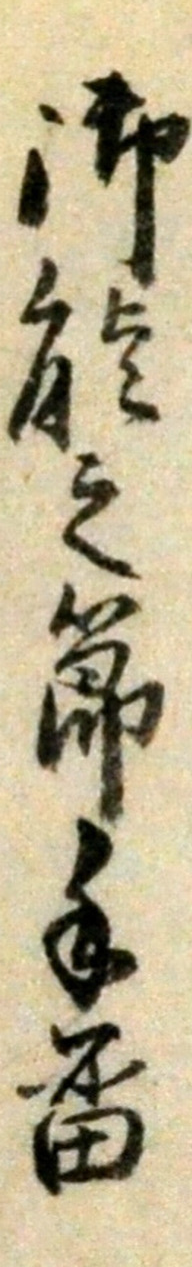御能之節手番
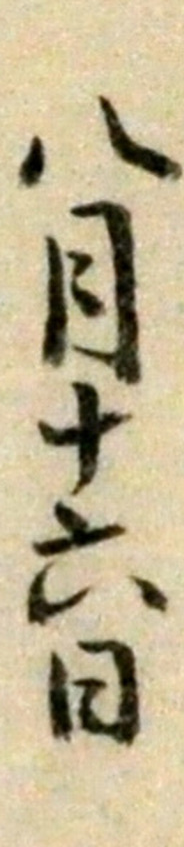八月十六日
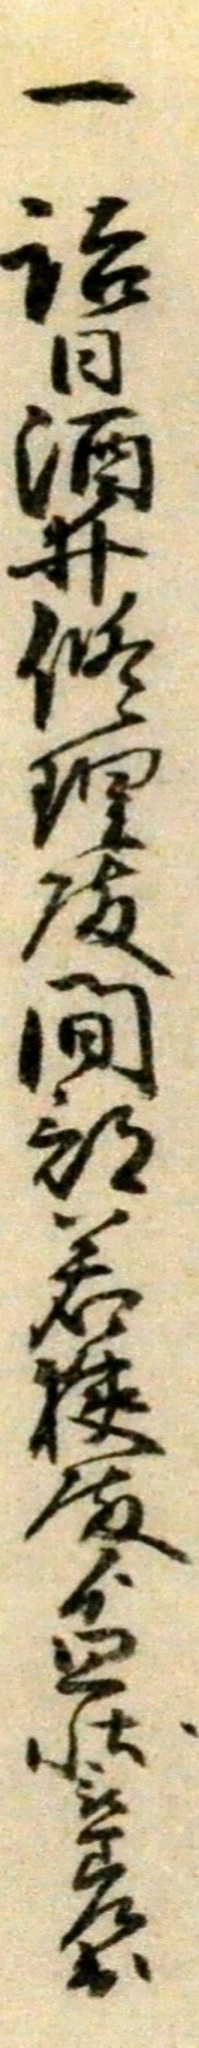一詰日酒井修理殿間部若狭殿ゟ廻状被差出
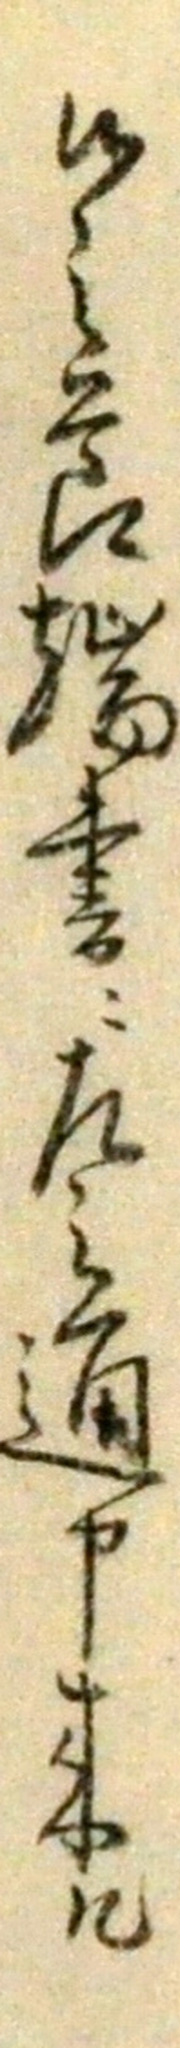候之節端書ニ左之通申来ル
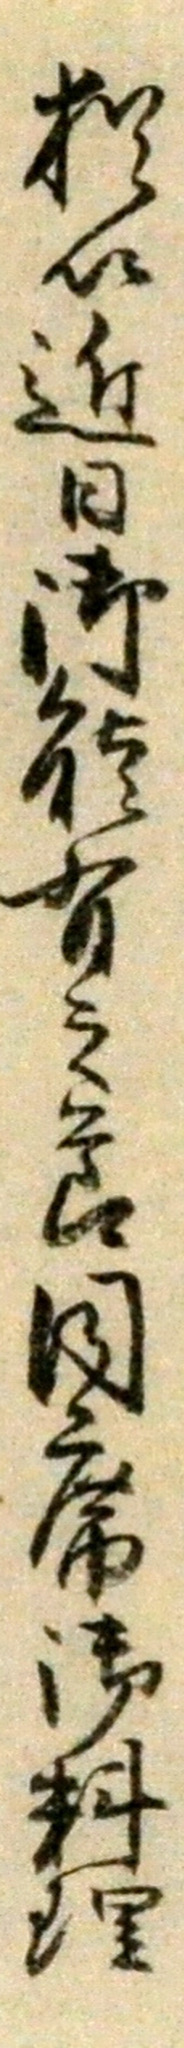猶以近日御能有之節同席御料理
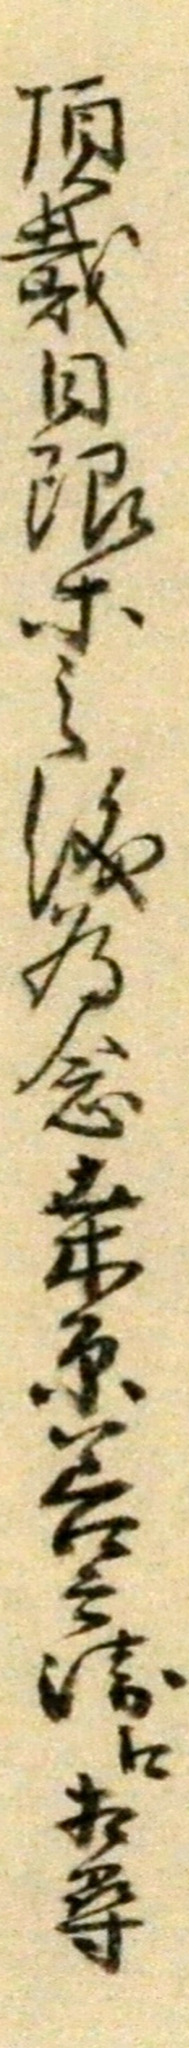頂戴日限等之儀為念桑原善兵衛え相尋
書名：若君様（家斉嫡男）誕生諸祝儀ノ節ノ留書外
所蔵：伊那市立高遠町図書館・合同会社AMANE
